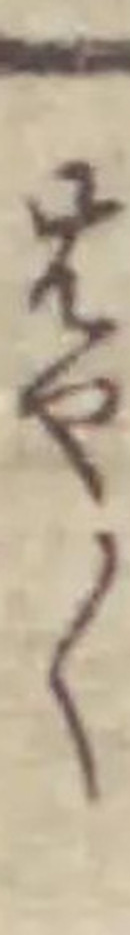はや〳〵
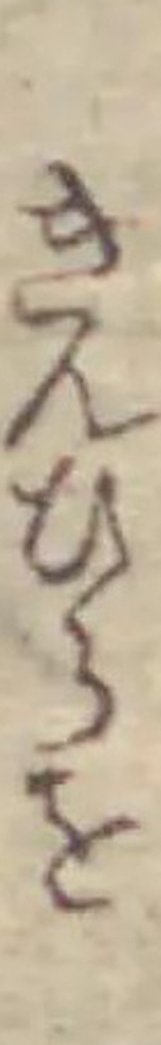きんひらを
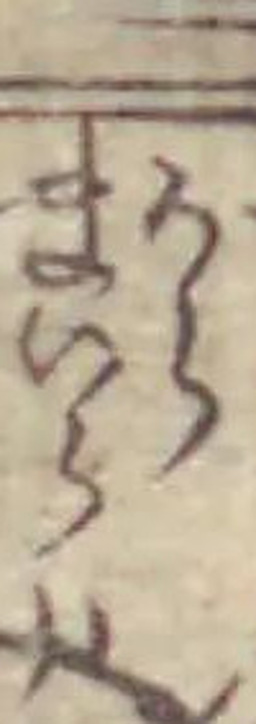まいら
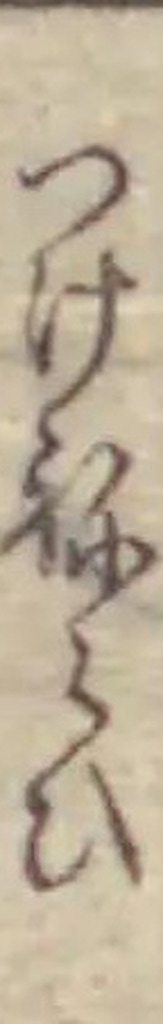つけねらひ
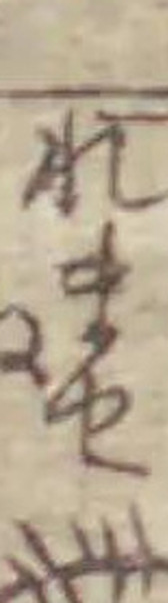れませ
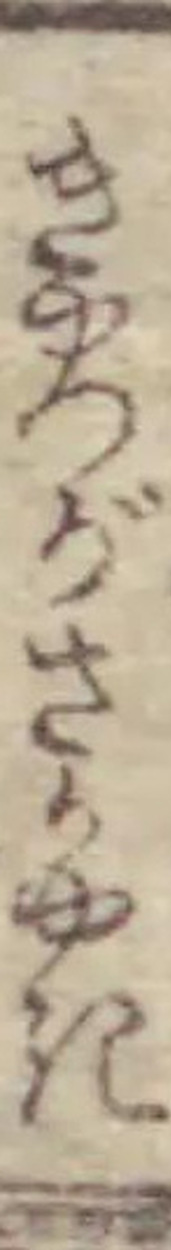きやつがさかやきに
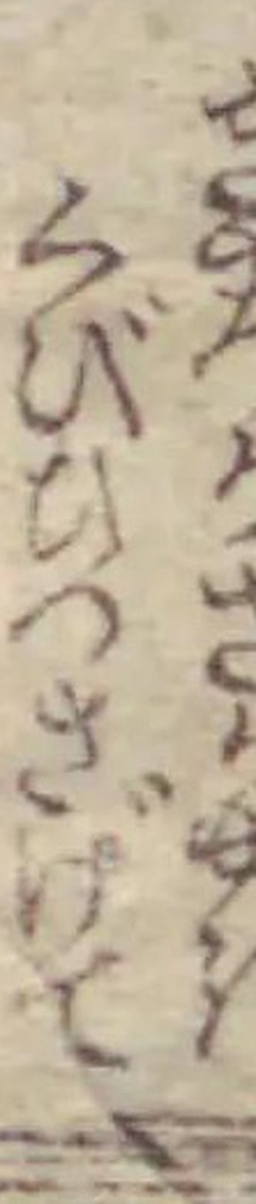くびひつさげて
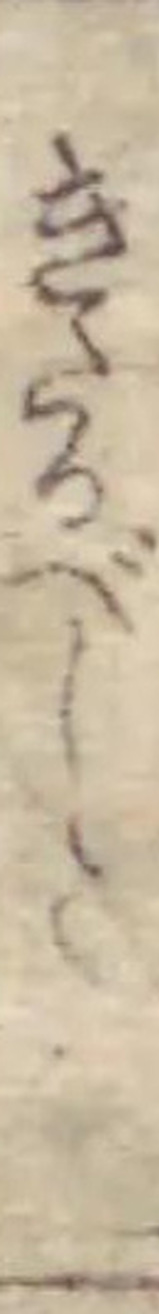きたるべしと
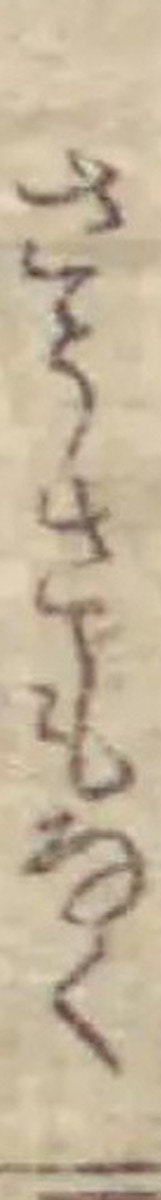さうさもなく
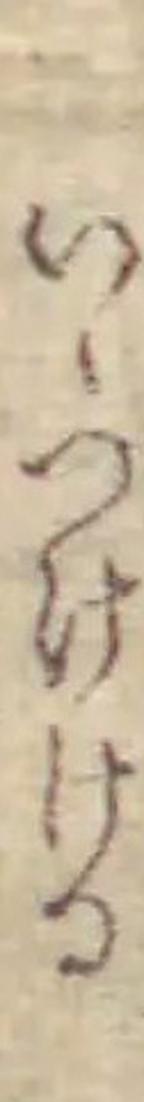いゝつける

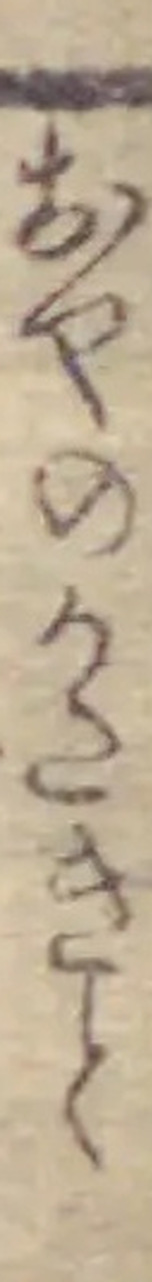おやのかたきと
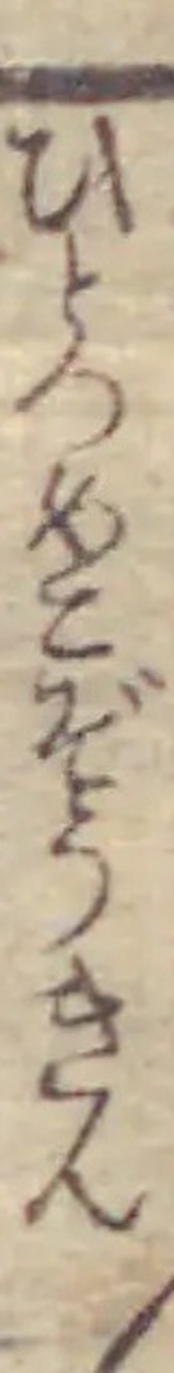ひとつめこぞうきん
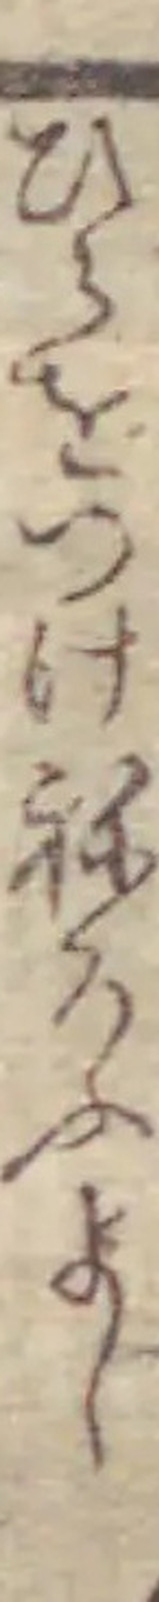ひらをつけねろふよし
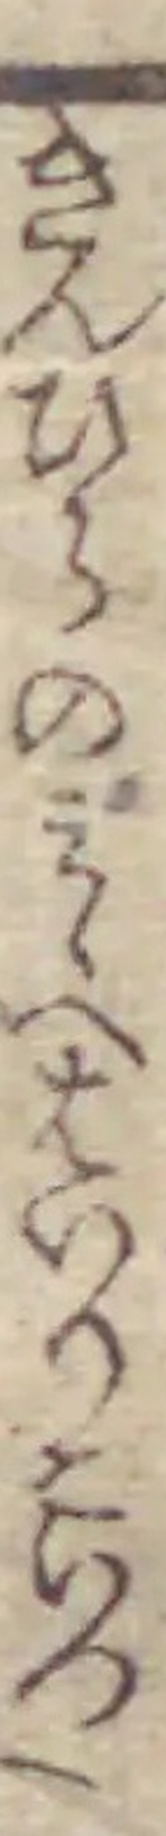きんひらのみゝへはいりこいつ
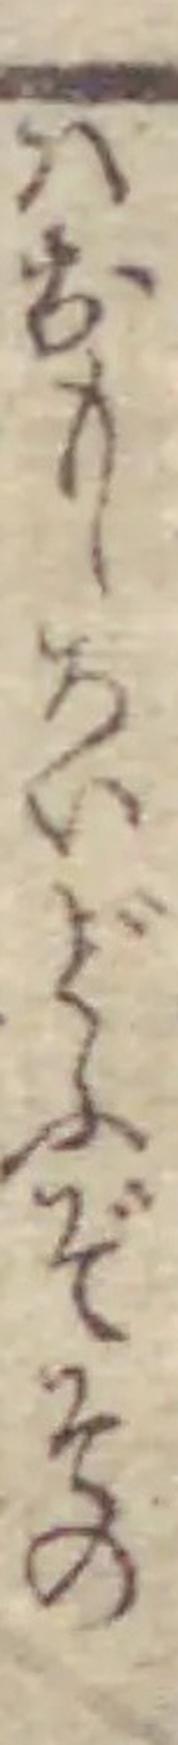はおもしろいどふぞその
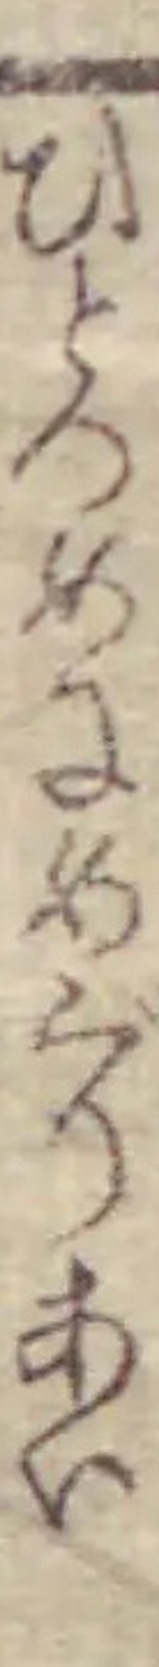ひとつめにめぐりあい
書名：化物敵討 2巻
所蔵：国立国会図書館 National Diet Library, JAPAN
